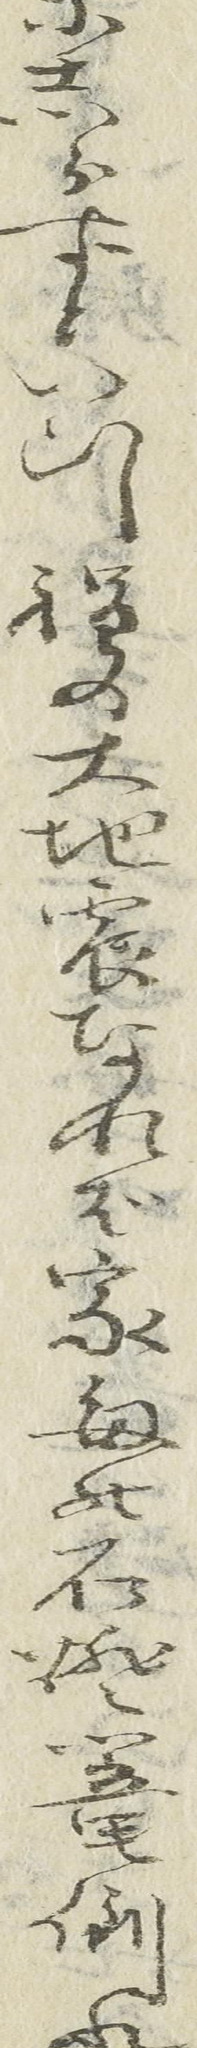に志らずといひし程の大地震なれば家毎の石燈篭倒れ
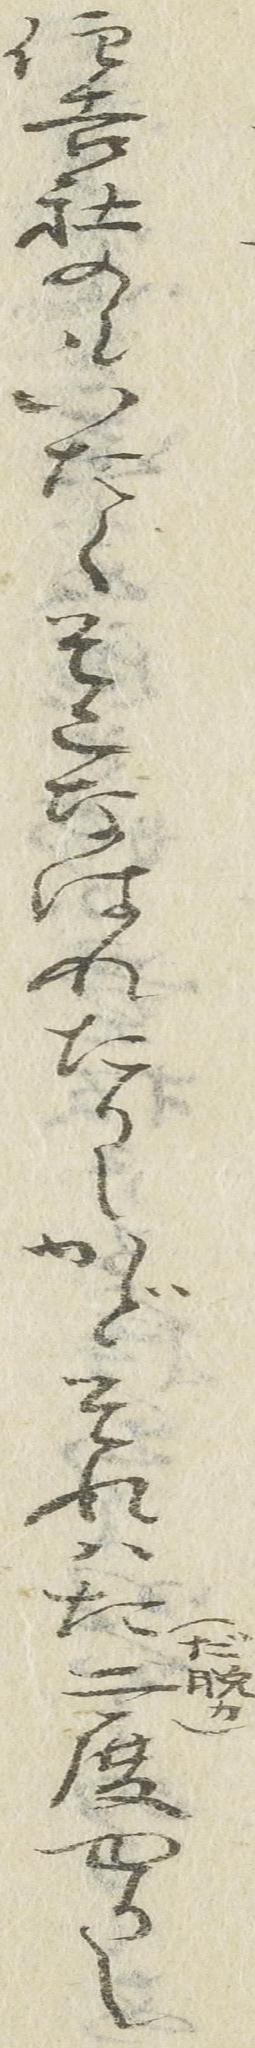住吉社のもいたくそこなはれたりしかどそれハた二度ゆりし
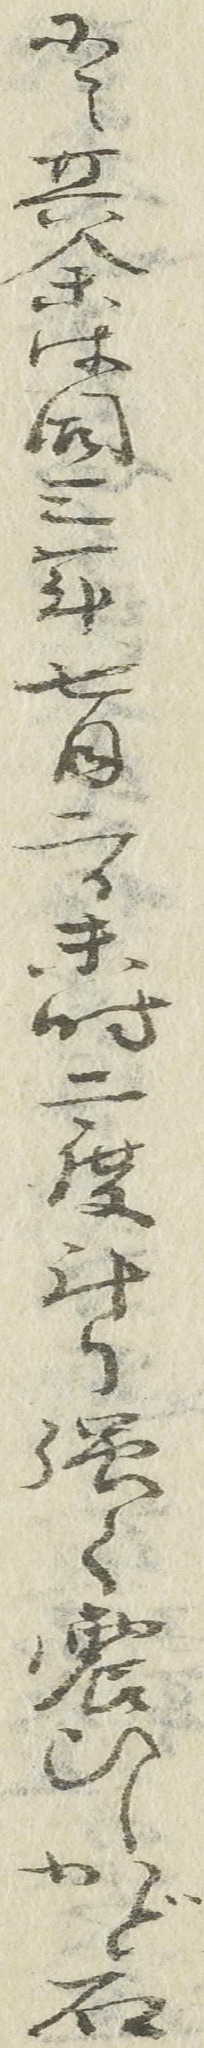にて其余は同三年七月二日未時二度計り強く震ひしかど石
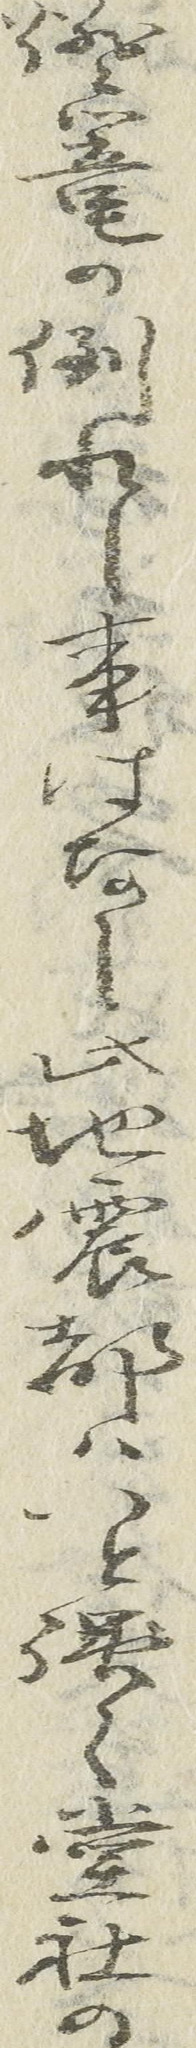燈篭の倒れし事はなし此地震都ハいと強く堂社の
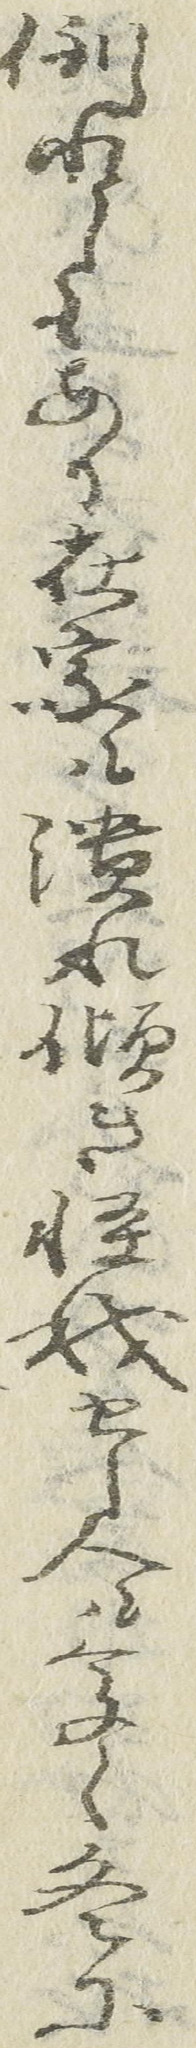倒れしもあり在家も潰れ傾き怪我セし人も多く冬に
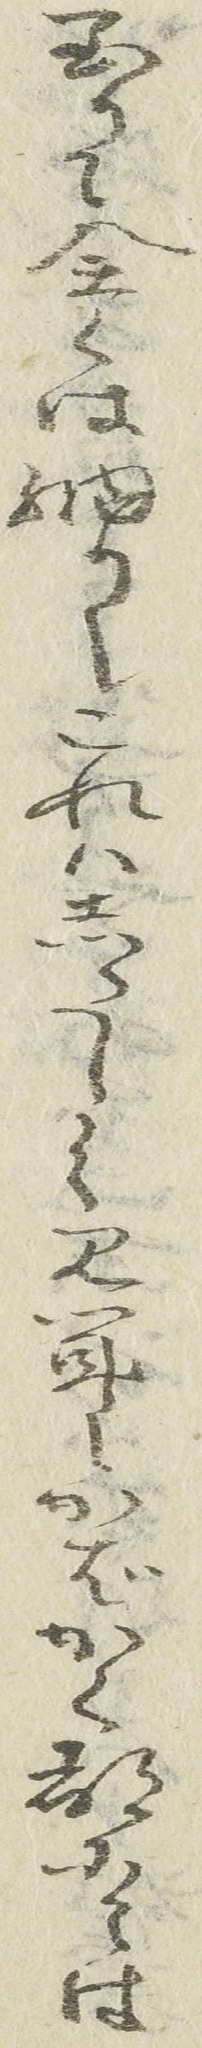至りて全くは納りしこれハしたしく見聞しかばかく都にては
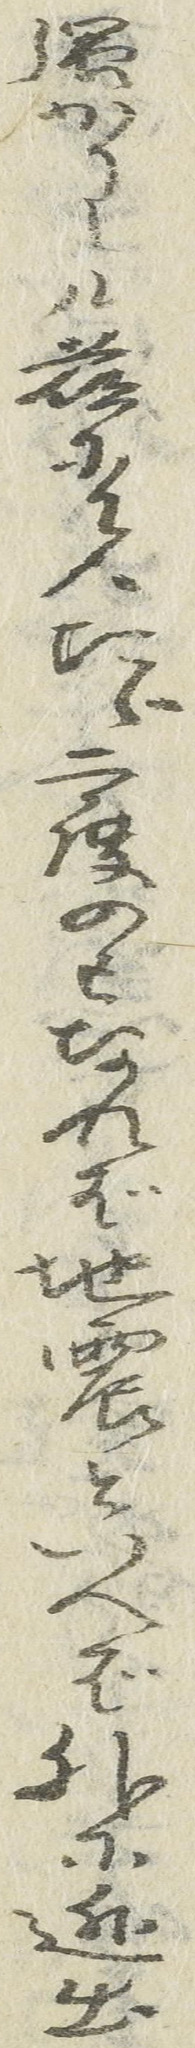強かりしも茲にてハたゞ二度のみなれば地震といへば外に逃出

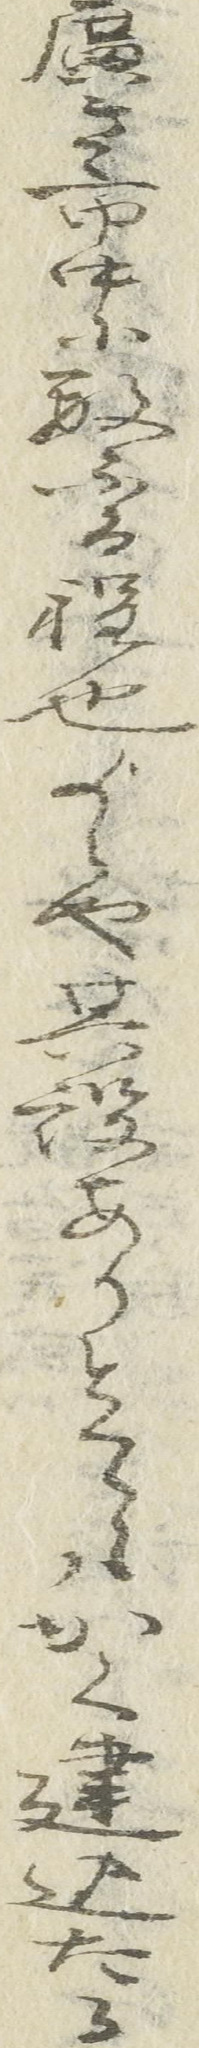広き市中に数ふる程也よしや其設ありとてもかく建込たる
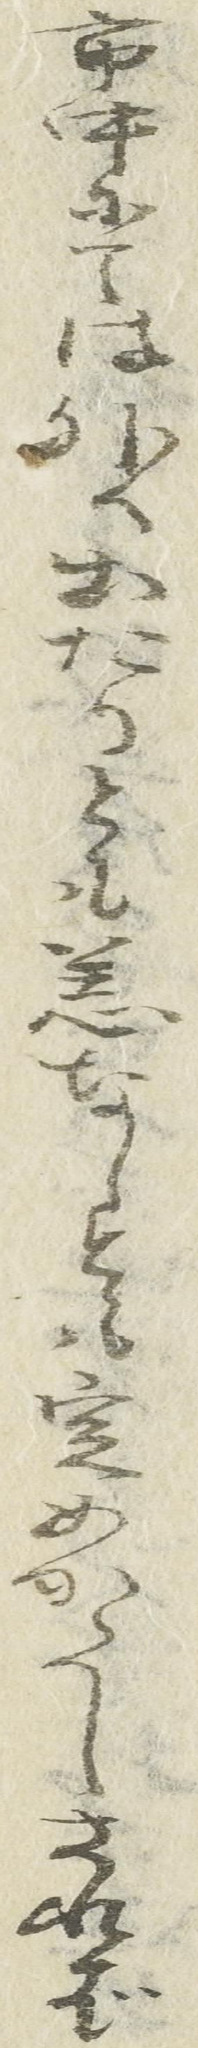市中にては外へ出たりとも恙なしとも定めかたしされば
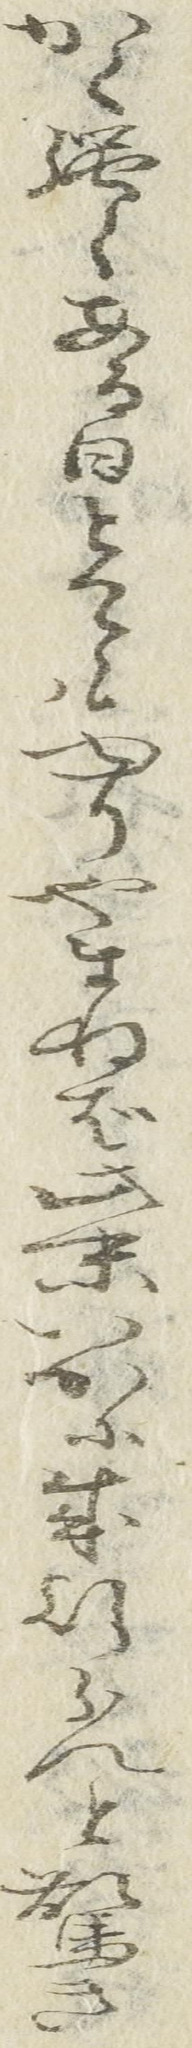かく強くある日とてもゆりやまねば此末いかに成行らんと驚き
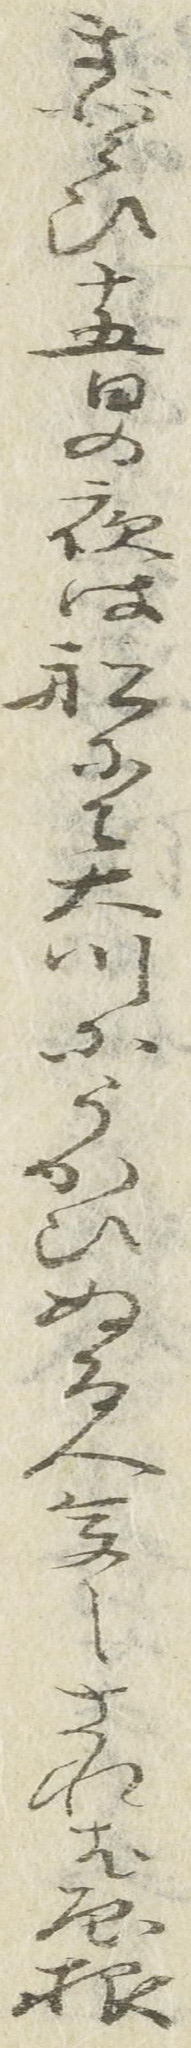まどひ十五日の夜は船にて大川にうかひぬる人多しされば屋根
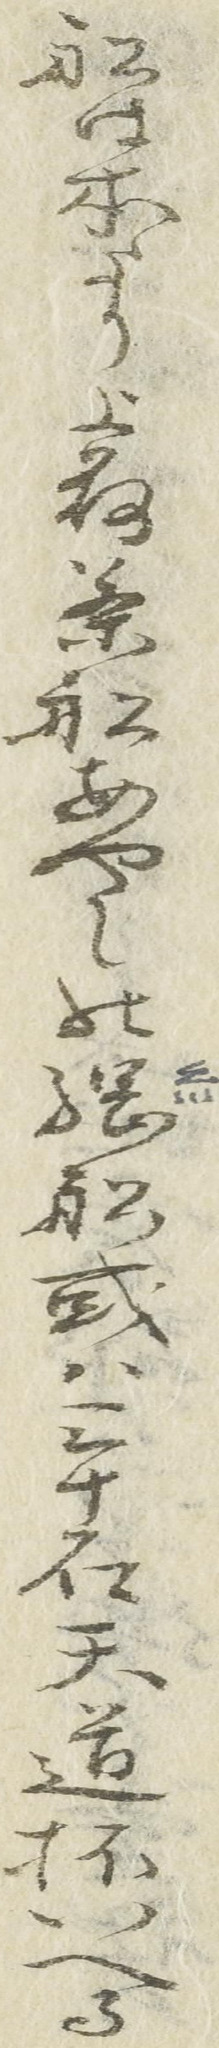船は本より上荷茶船あやしの網船或ハ三十石天道抔いへる
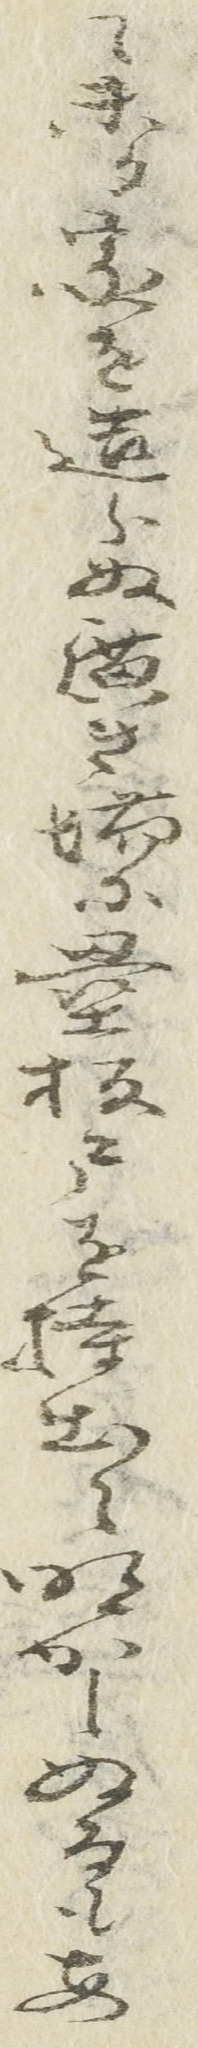て未タ家を造らぬ広き場に塁板戸を持出し明かしぬるもあ
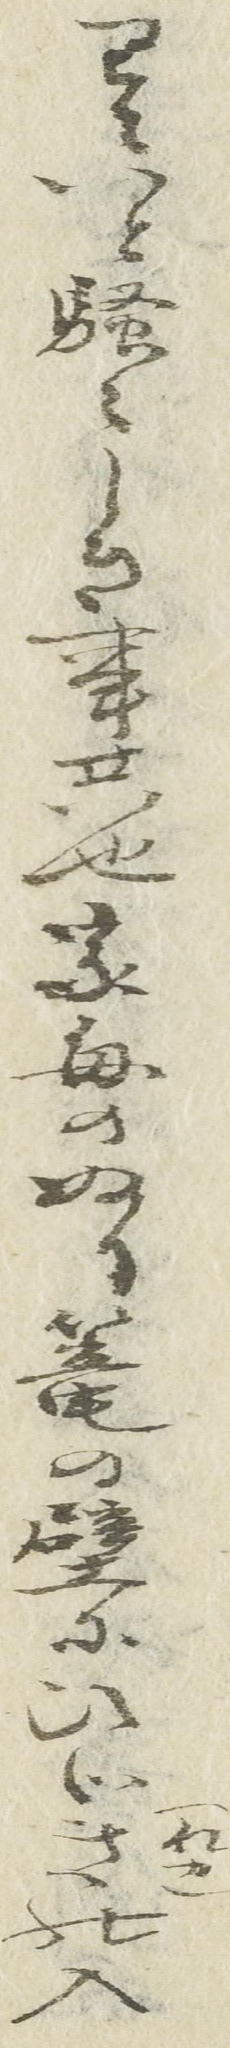わていと騒々しき事共也家毎のぬり篭の壁にひゞきの入
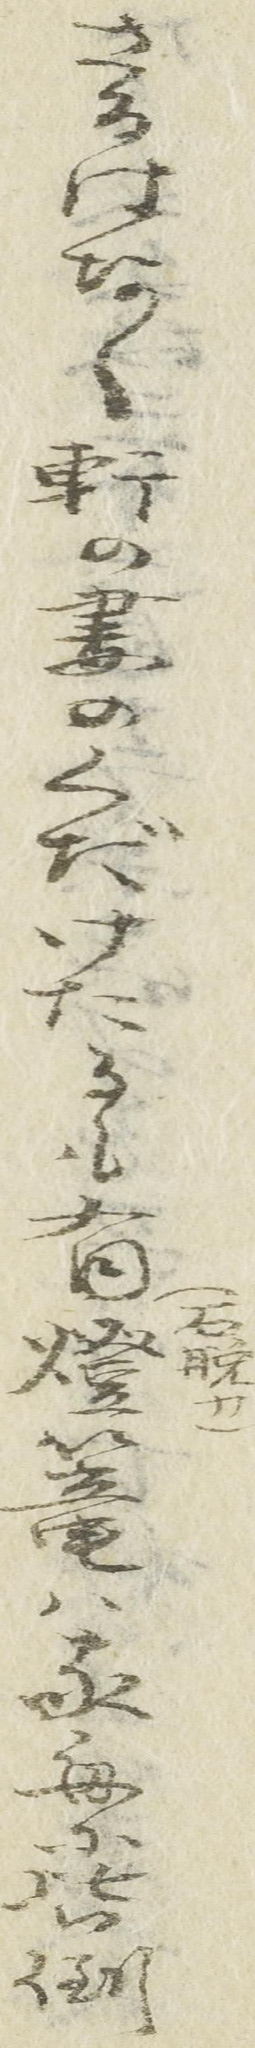さるはなく軒の妻のくだけたるも有灯篭ハ家毎に皆倒
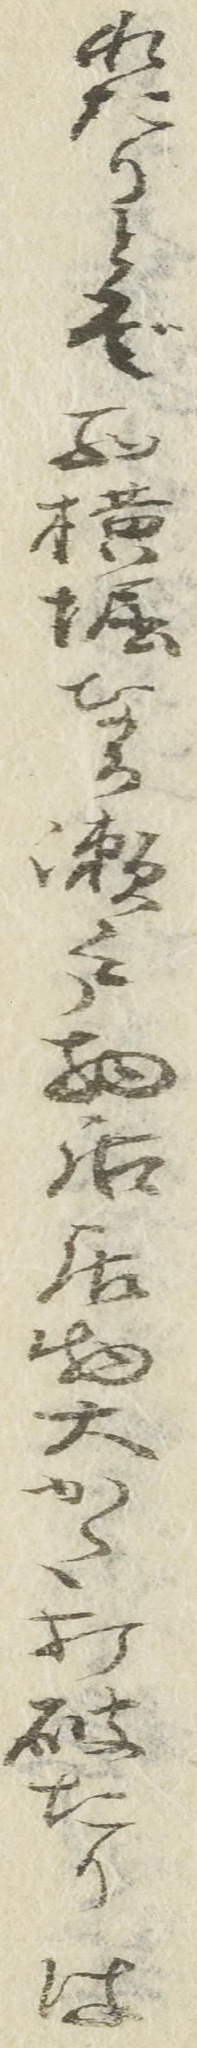れたりとぞ西横堀なる瀬戸物店店物大かた打破たりは
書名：地震前兆集　全
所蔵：東京大学地震研究所図書室 Earthquake Research Institute Library, The University of Tokyo, JAPAN
